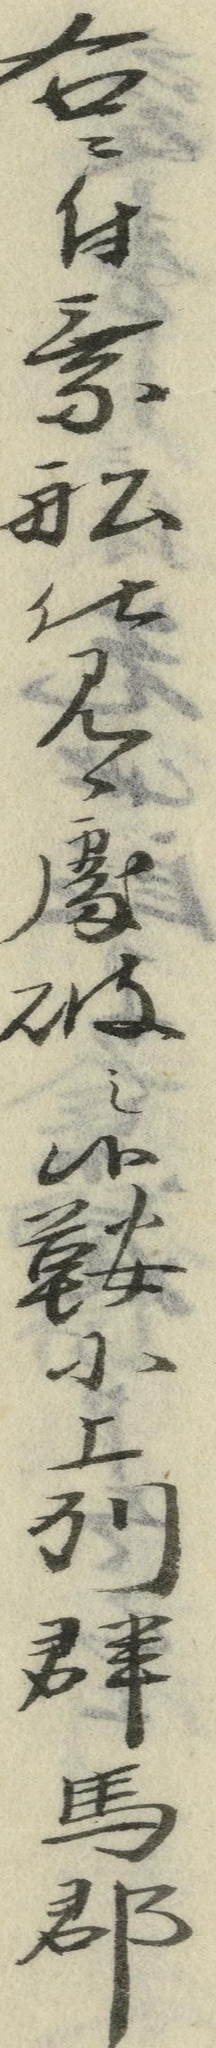右ニ付乗船仕見候処破レ候鞍に上州群馬郡
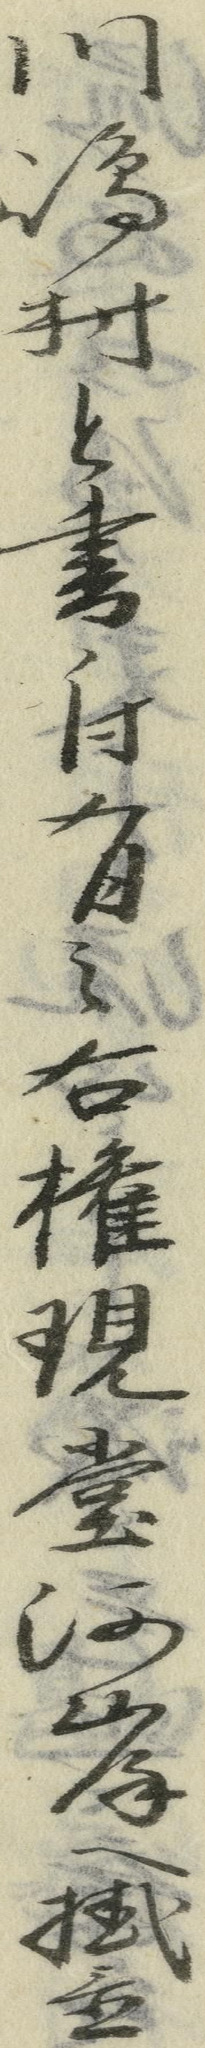川嶋村と書付有之右権現堂河岸へ掛置
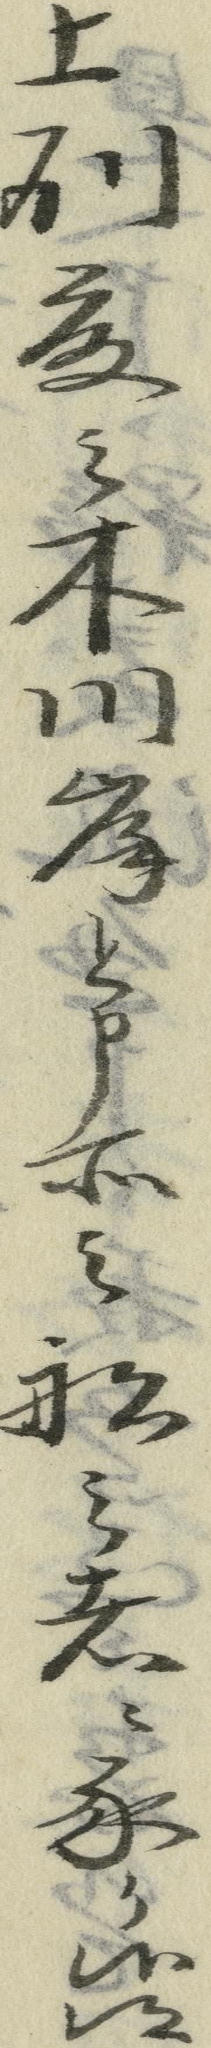上州藤之木川岸と申所之船之者ニ承り候得
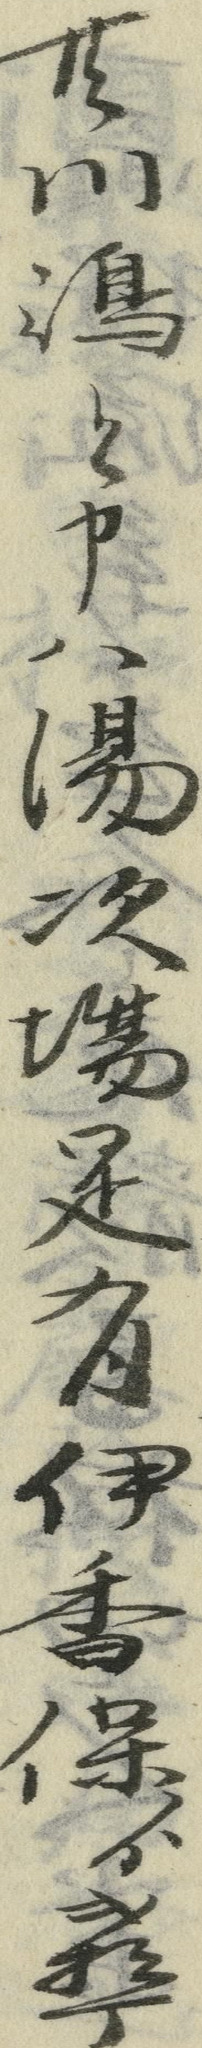共川嶋と申は湯次場足有伊香保ゟ弐拾丁
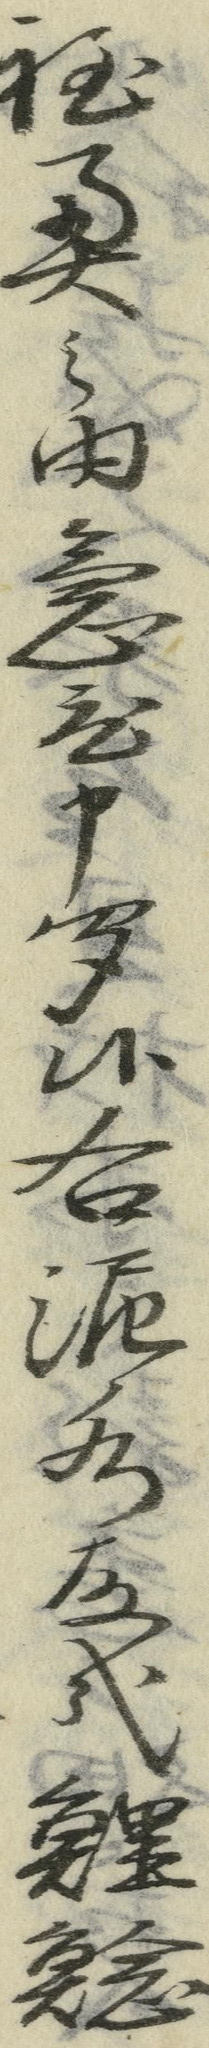程奥之由急度申聞候右泥水故哉鯉鯰
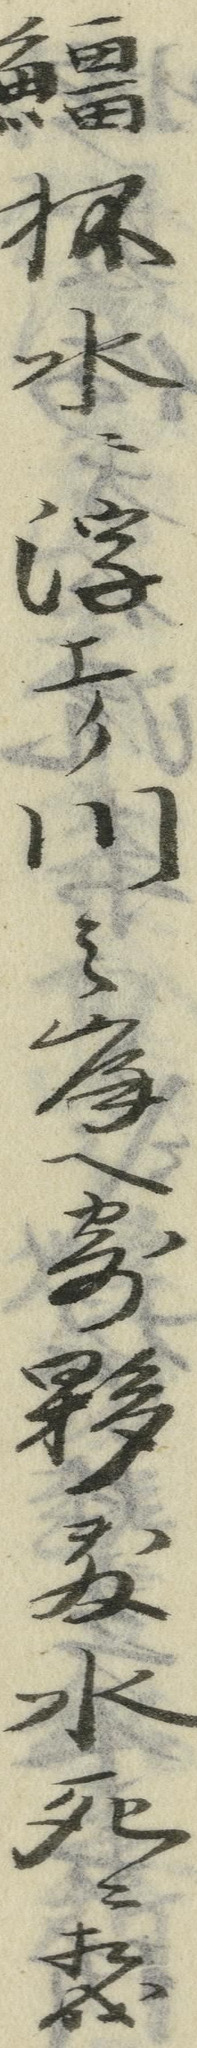鱣抔水ニ浮上リ川之岸へ寄夥敷水死ニ相成
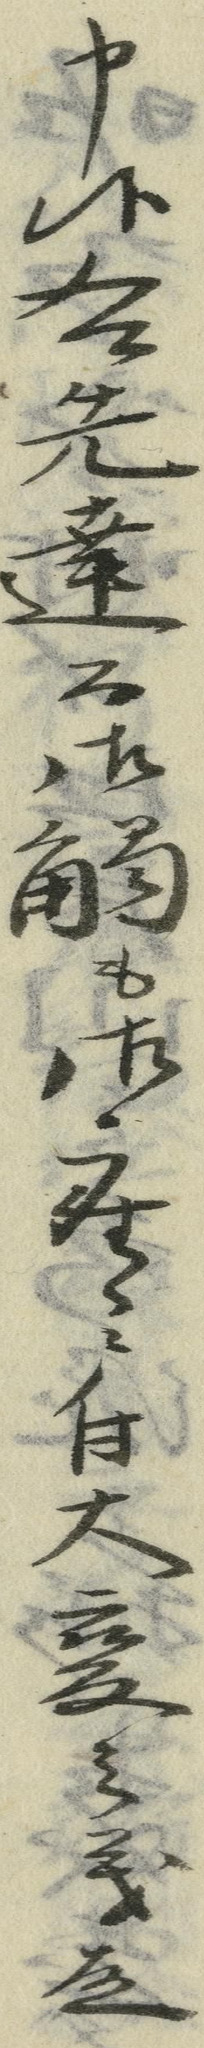申候右先達而御触も御座候ニ付大変之義故
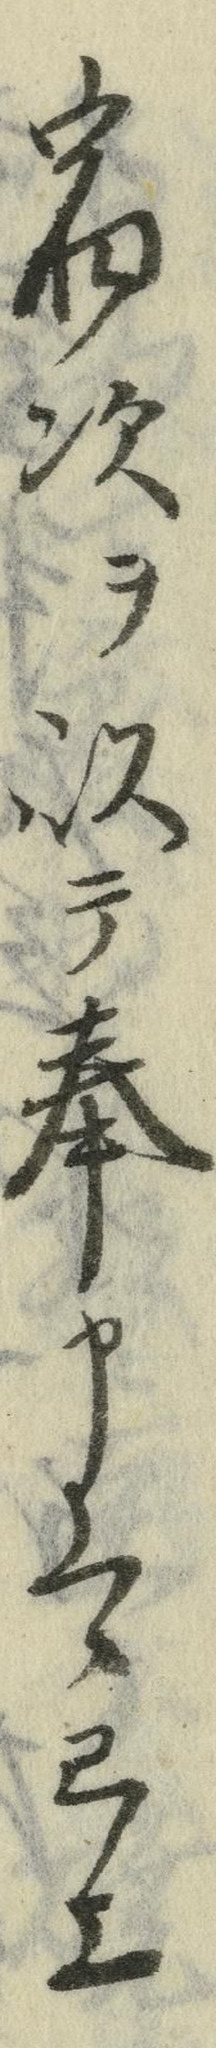宿次ヲ以テ奉申上候已上
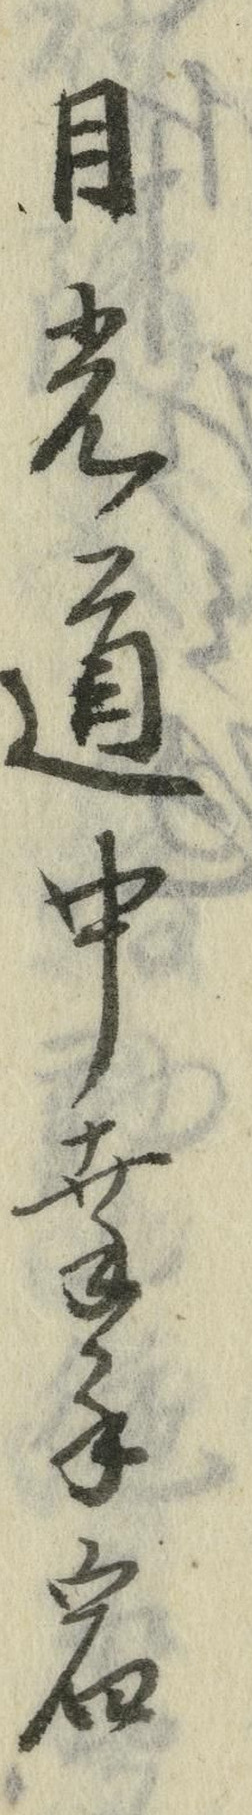日光道中幸手宿
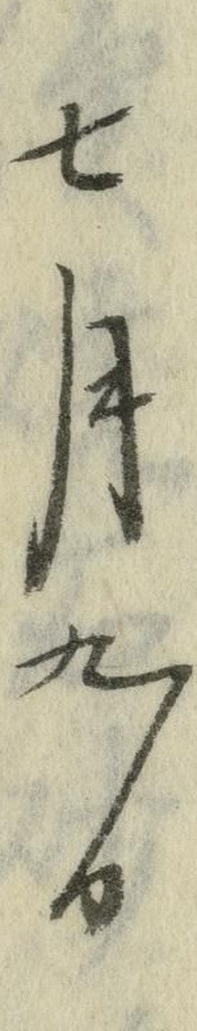七月九日
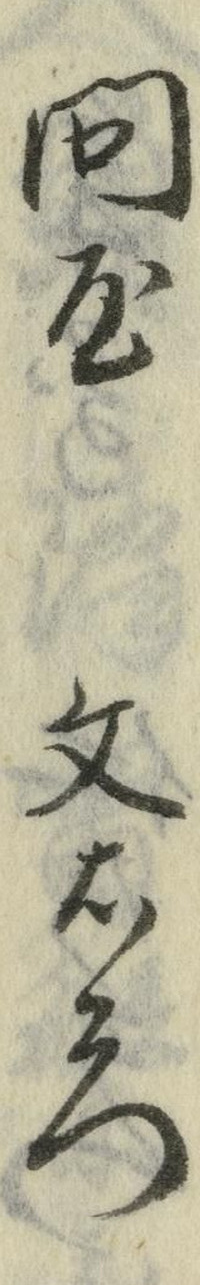問屋文右衛門

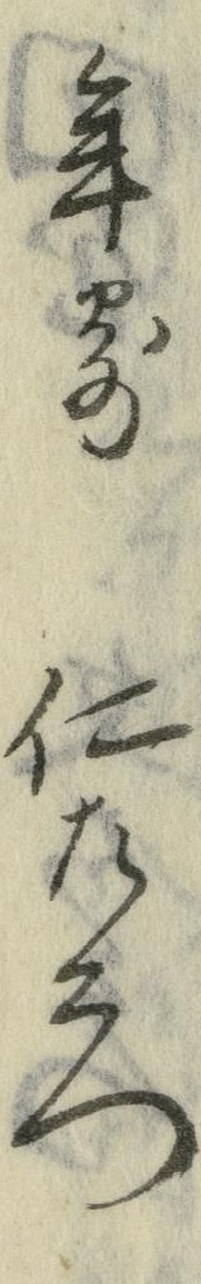年寄仁左衛門
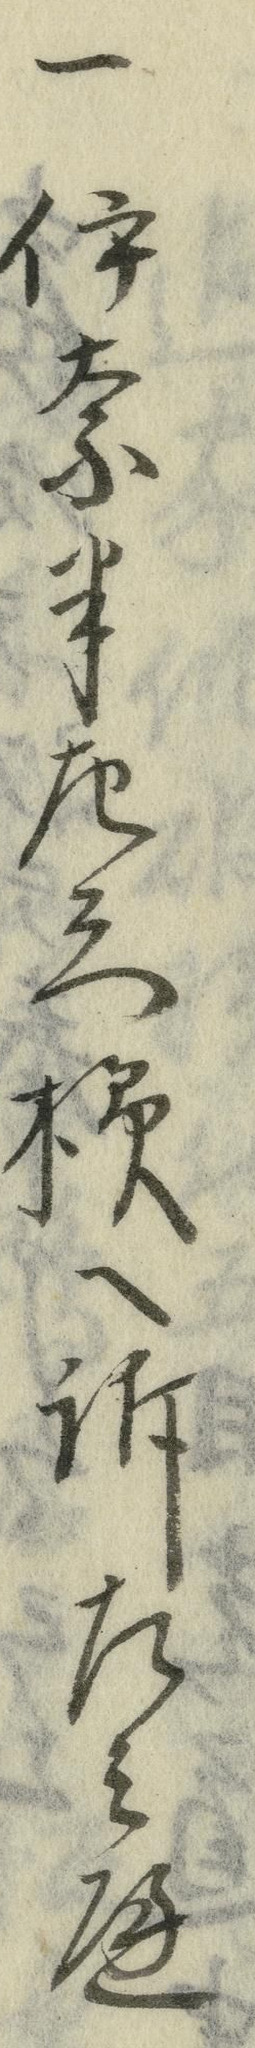一伊奈半左衛門様ヘ訴左之通
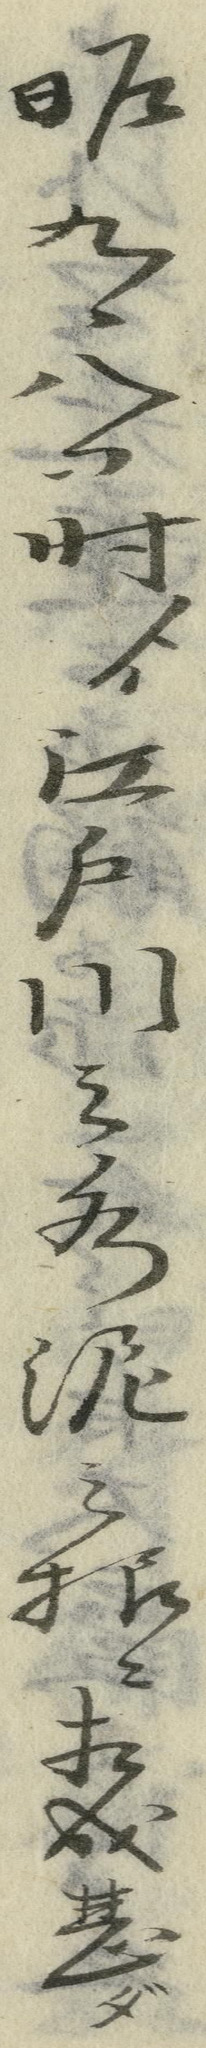昨九日八ツ時ゟ江戸川之水泥之様ニ相成甚ダ
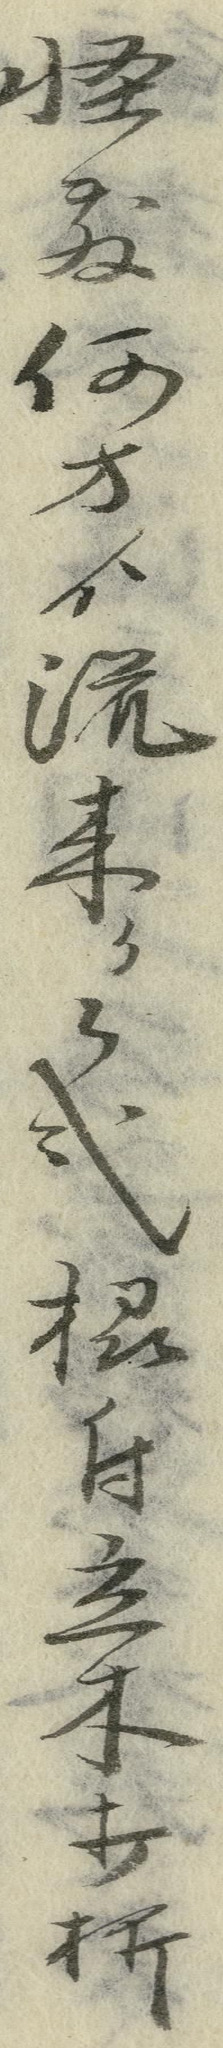怪敷何方ゟ流来り候哉根付立木打折
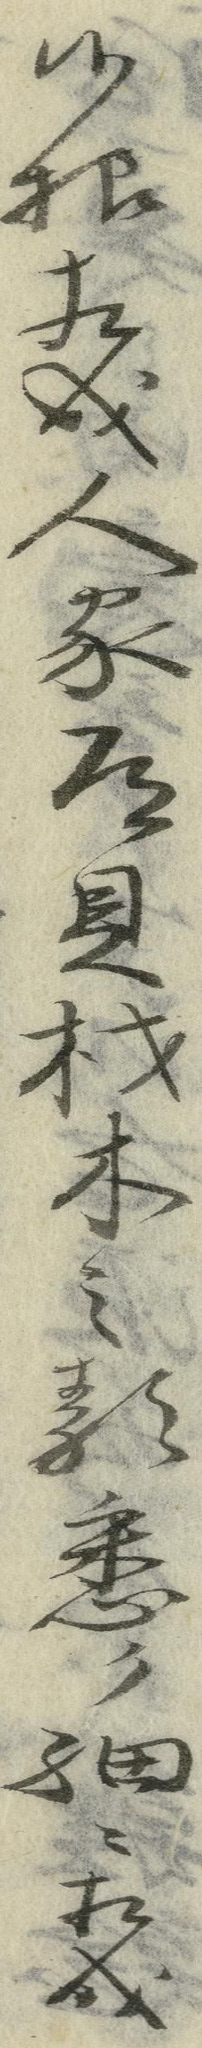候様相成人家道具材木之類悉ク細ニ相成
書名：天明三癸卯七月信州浅間山焼出シ上州山津浪ニ付近國ヨリ御届書并訴書写
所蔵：東京大学地震研究所図書室 Earthquake Research Institute Library, The University of Tokyo, JAPAN
